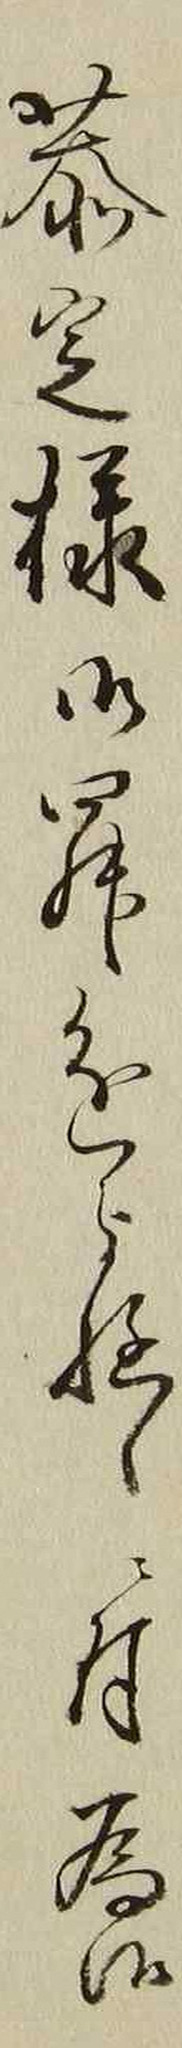恭定様御昇進被遊候ニ付為御
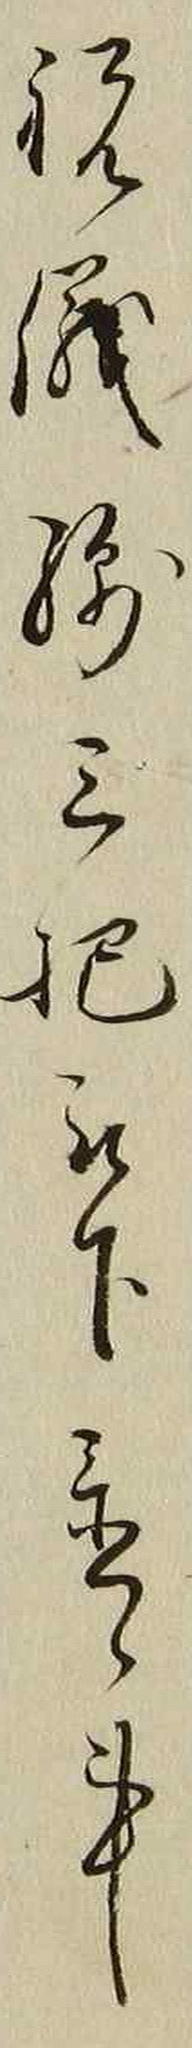祝儀綿三肥被下置候事
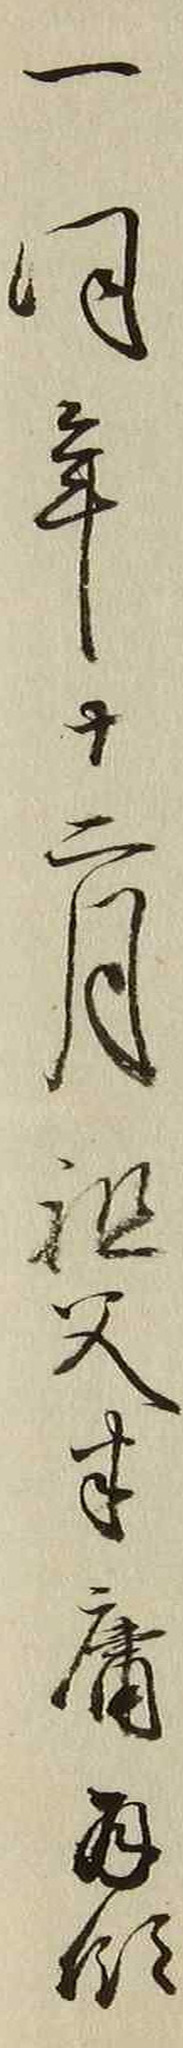一同年十二月祖父半庸拝領
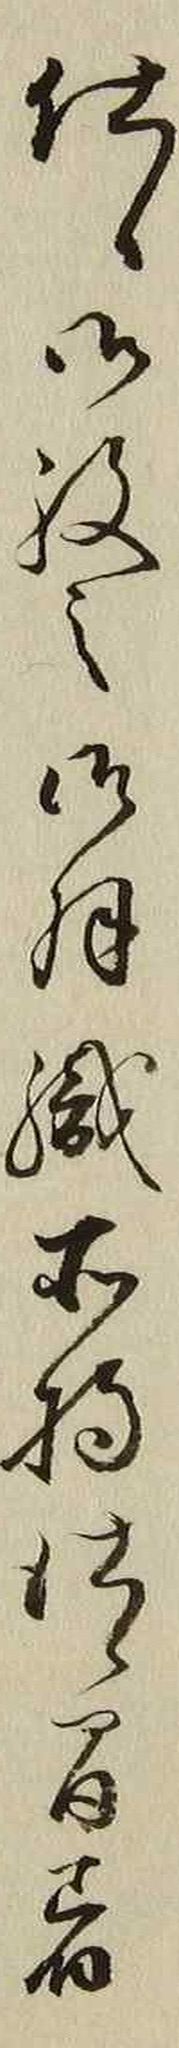仕候御紋之御羽織所持仕候間着
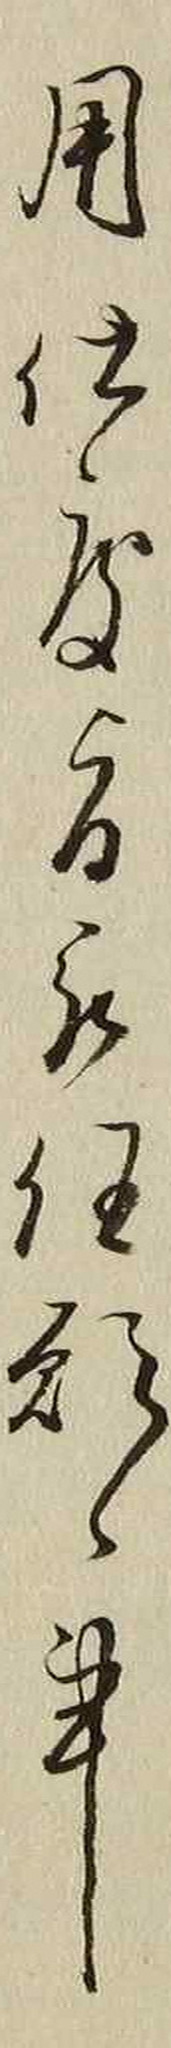用仕度旨被任願候事
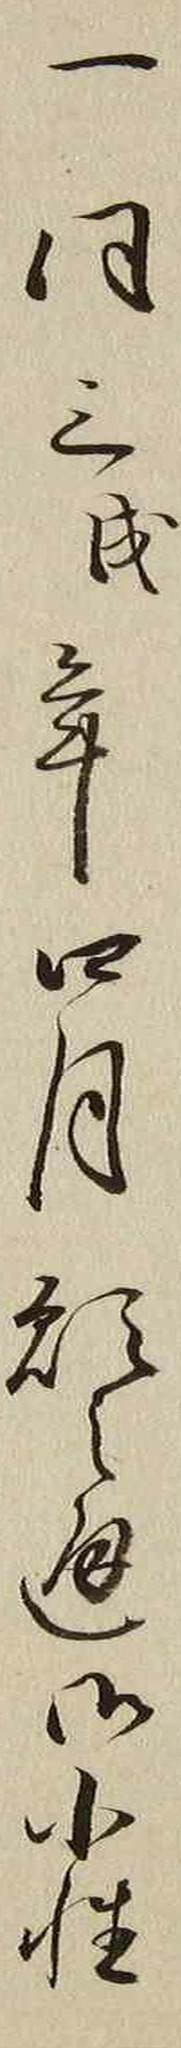一同三戌年四月願之通御小性
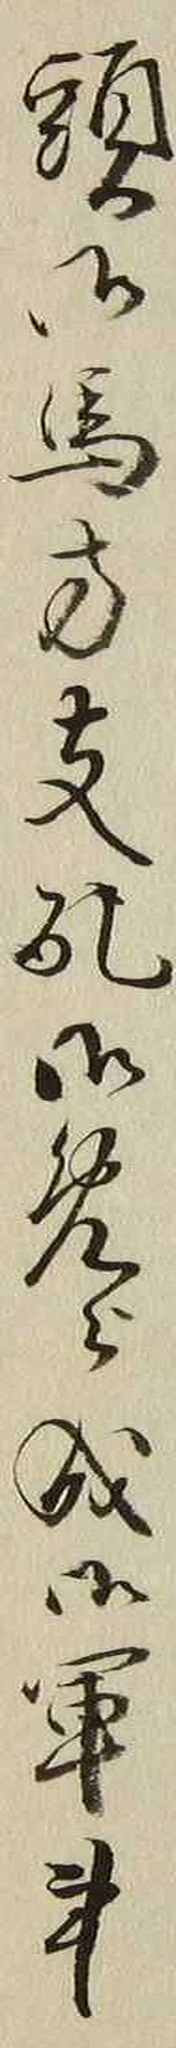頭御馬方支配御免被成御軍事
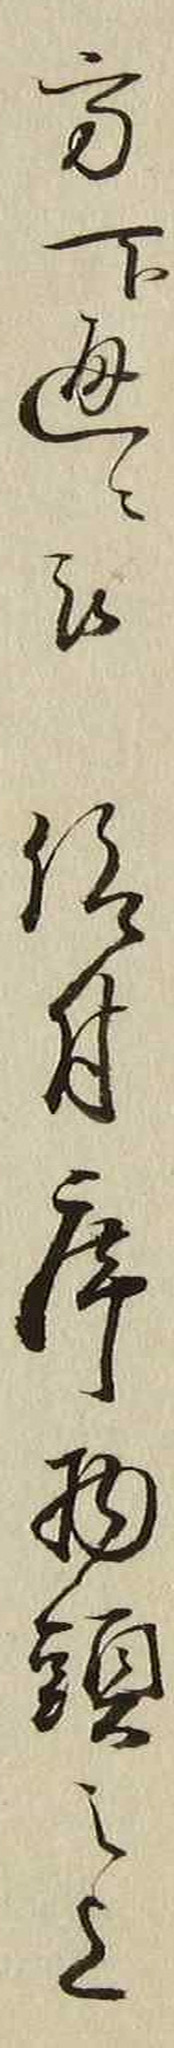方下通ニ被仰付席物頭之上
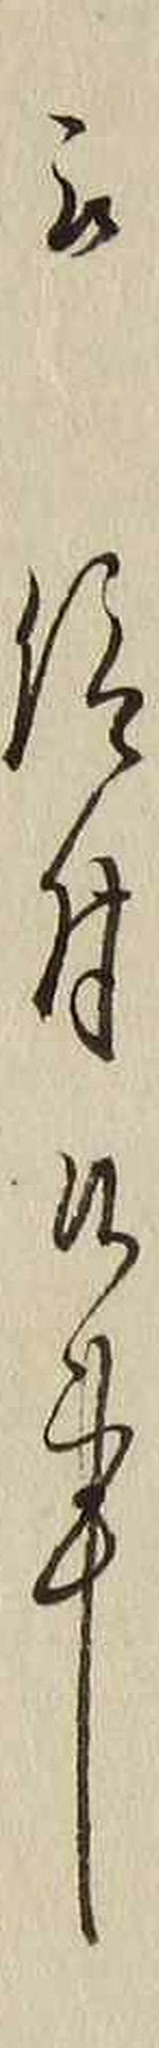被仰付候事
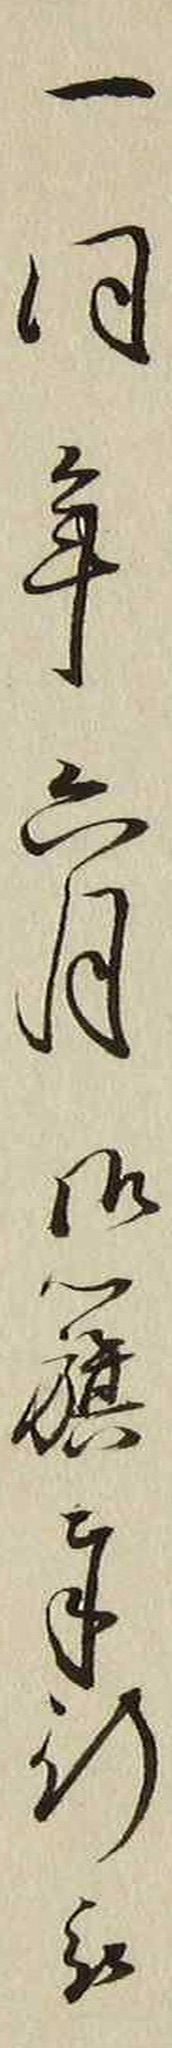一同年六月御籏奉行被
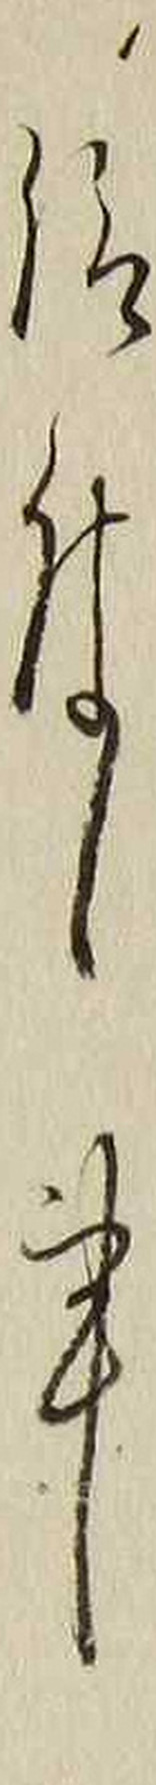仰付候事
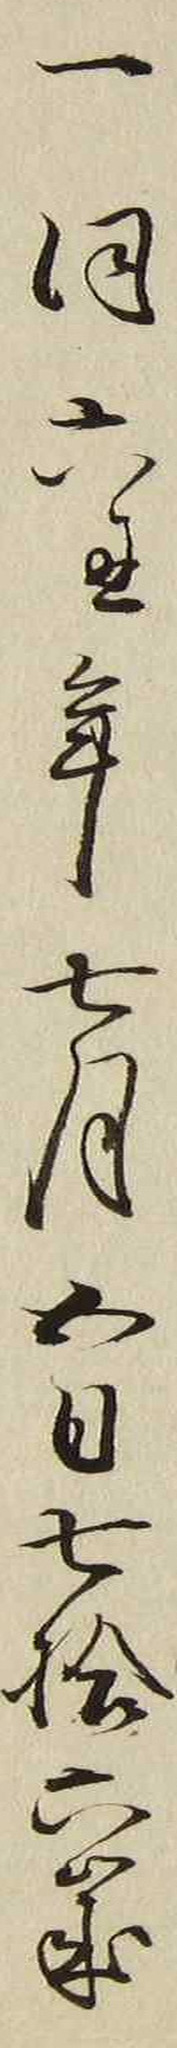一同六丑年七月五日七拾六歳
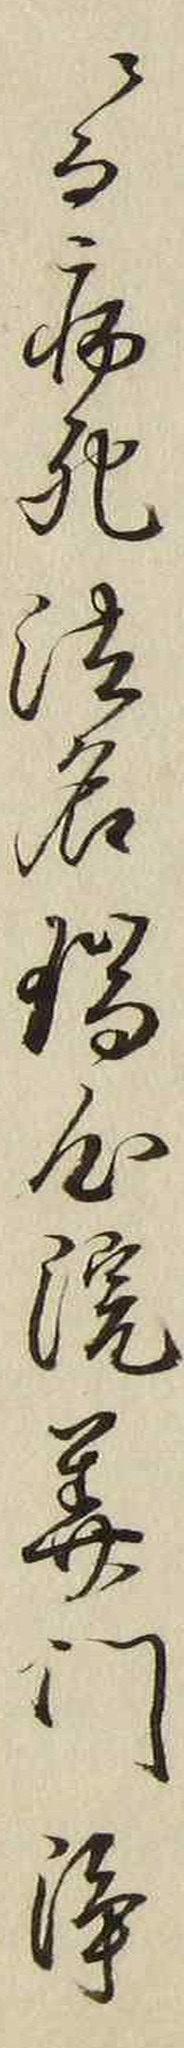ニ而病死法名瑞心院華門浄

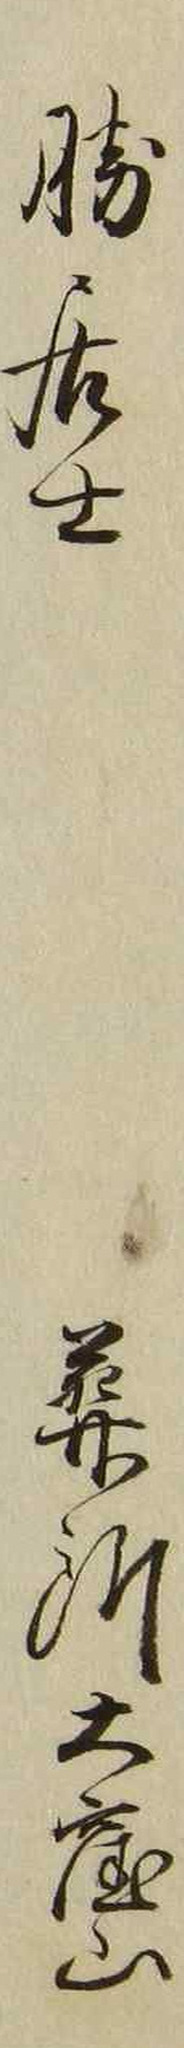勝居士葬所大窪山
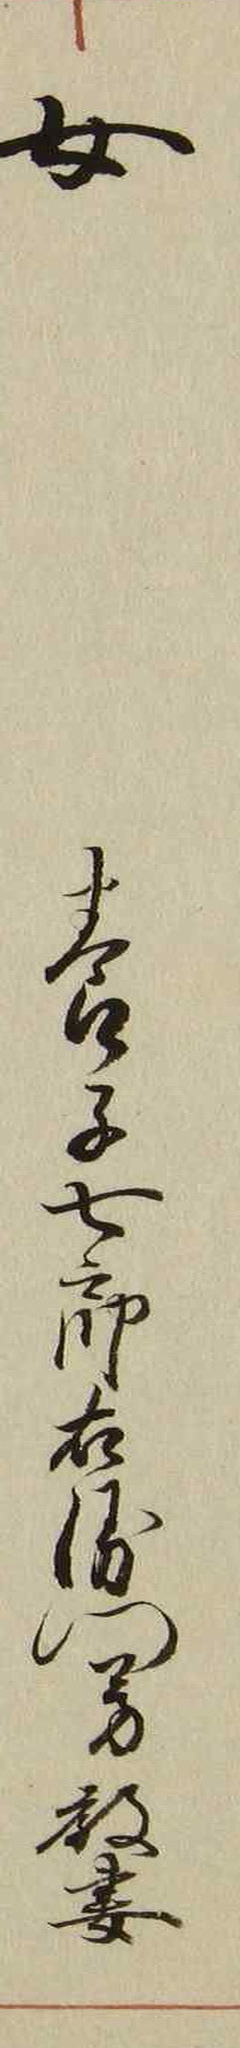女養子七郎右衛門芳教妻
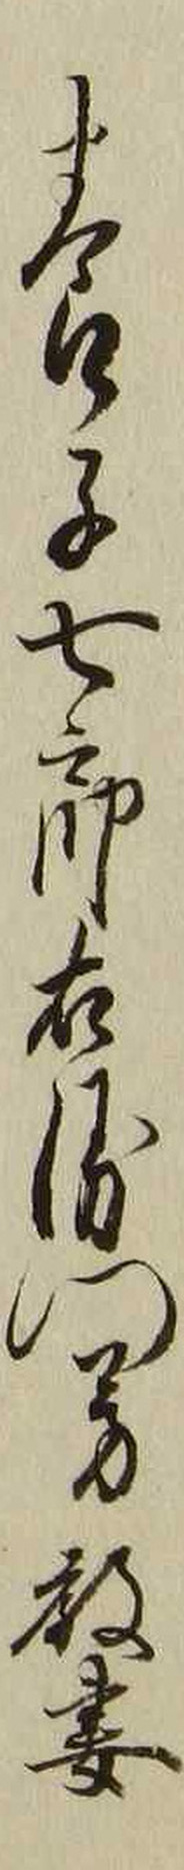女養子七郎右衛門芳教妻
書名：諸士系譜　巻之1　い之部1
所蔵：会津若松市立会津図書館
